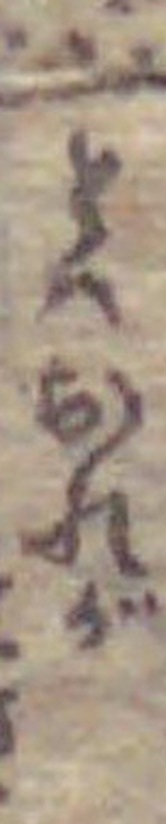とはおれが
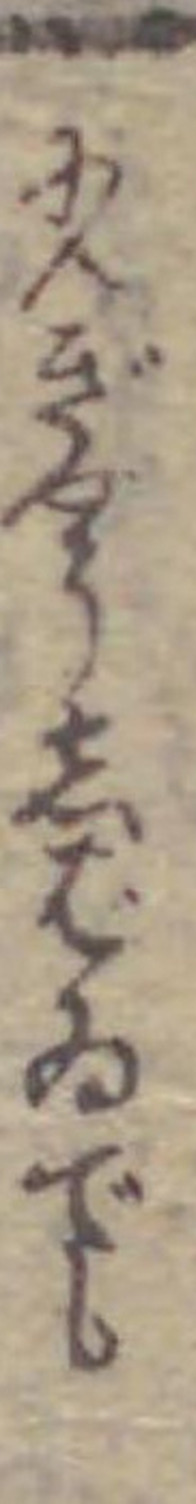にんぎやうしばゐでも
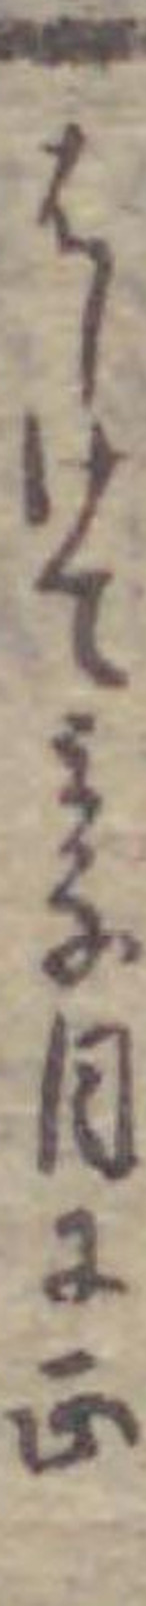はしけてみる目に正
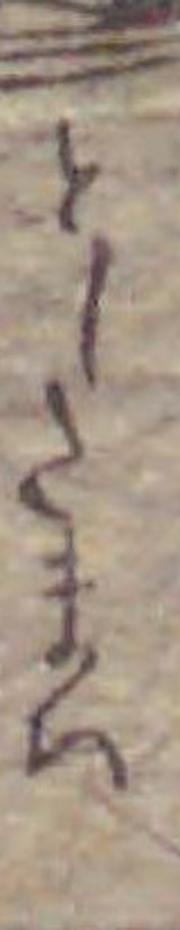としたまは
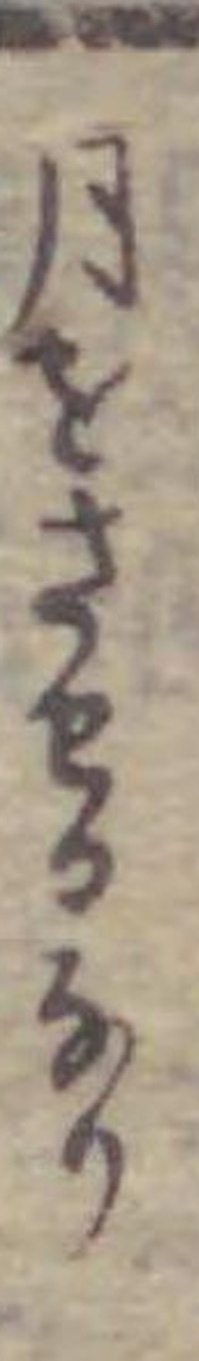月をさせるなり
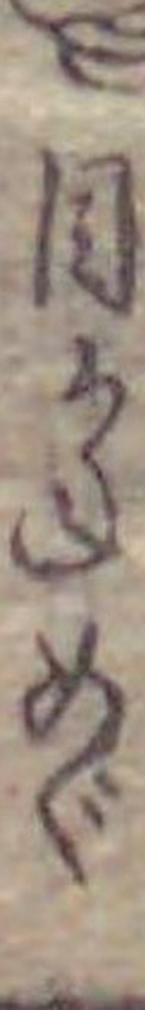目が年めぐ
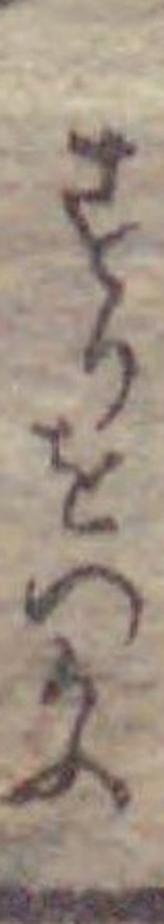すりをつかふ
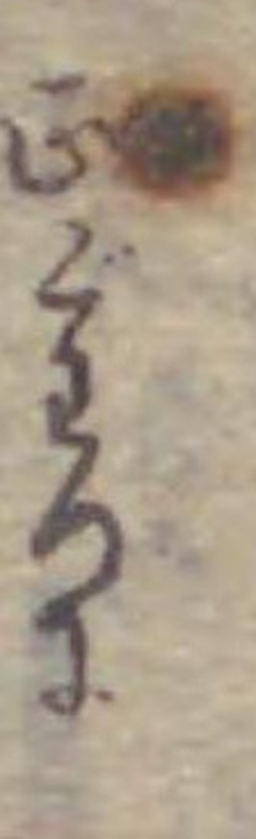正ぐわつに
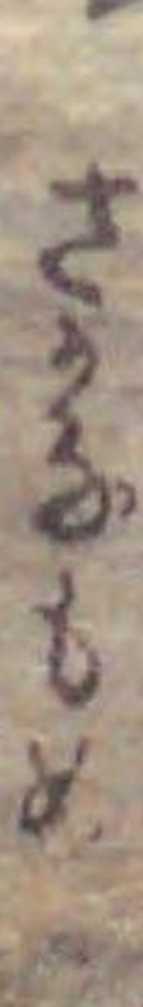さかなもめ
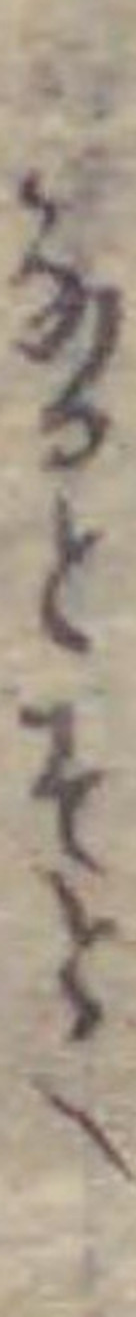なるとそとへ
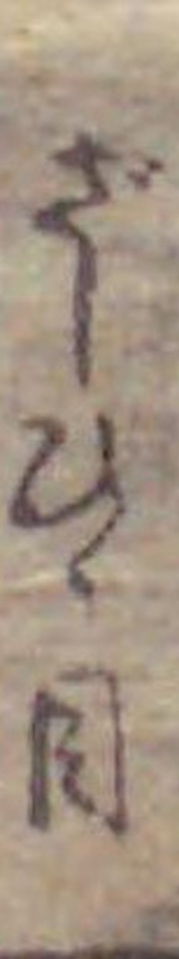ざしひら目
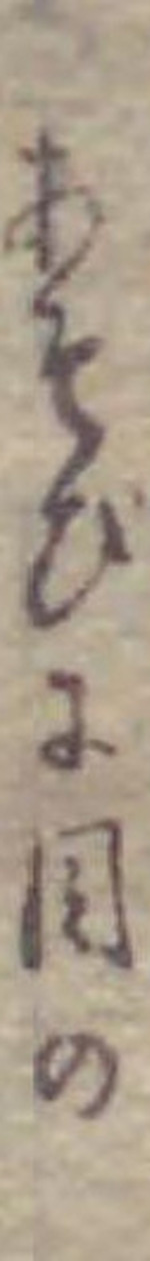あそびに目の
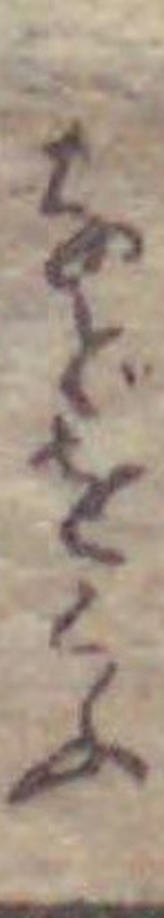などをくふ
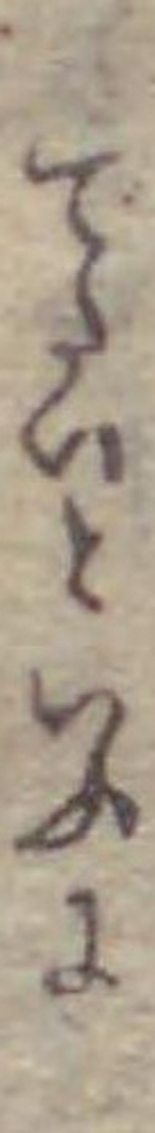でたいといふに
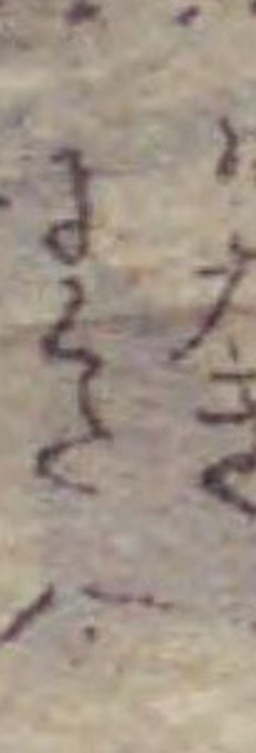にくた
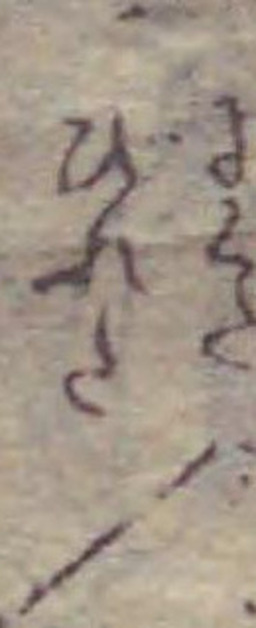びれた
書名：五躰不具毒解薬 : 3巻
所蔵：国立国会図書館 National Diet Library, JAPAN
